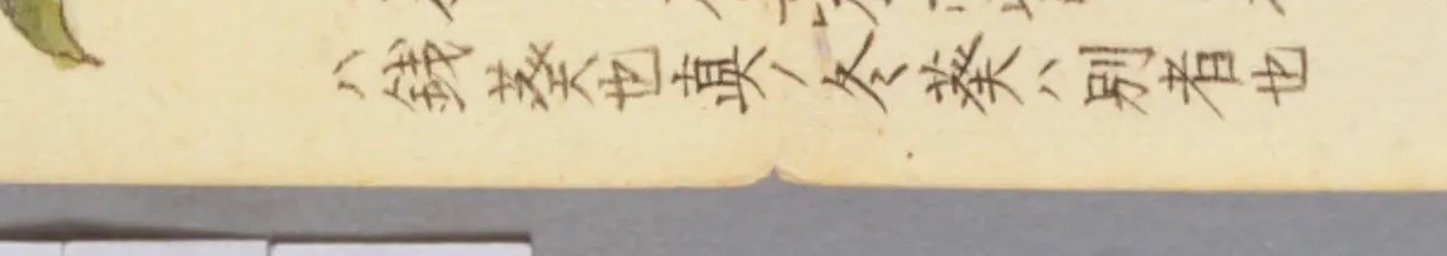ハ銭葵也真ノ冬葵ハ別物也

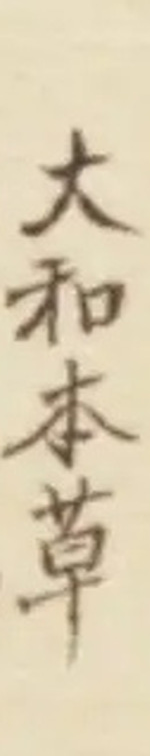大和本草
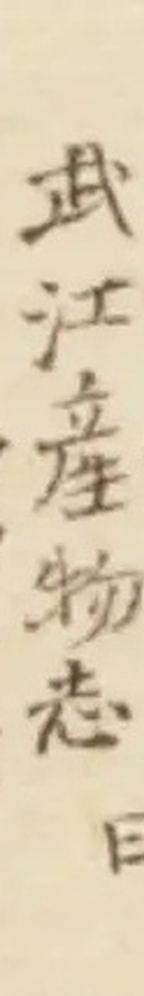武江産物志曰
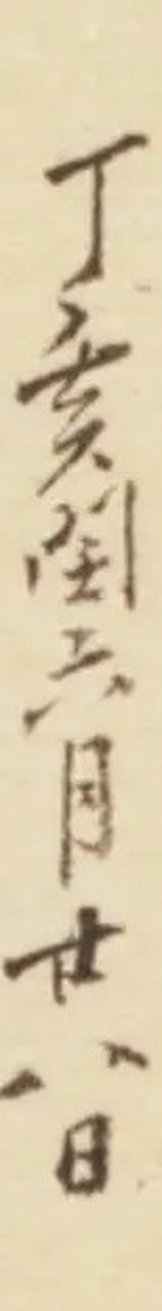丁亥閏六月廿八日
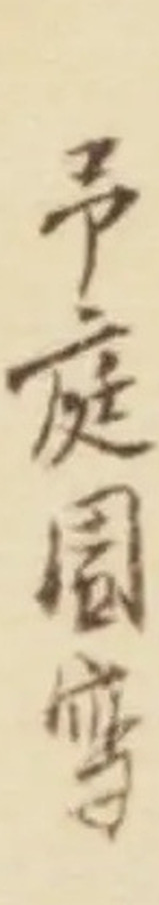予庭園写
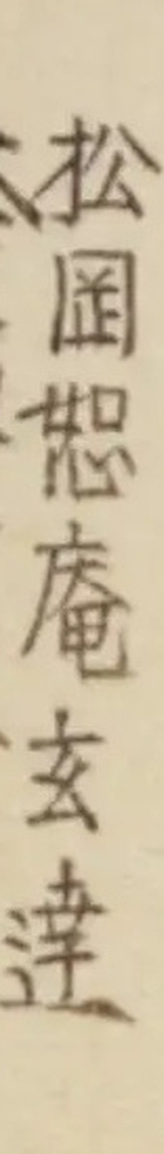松岡恕庵玄達
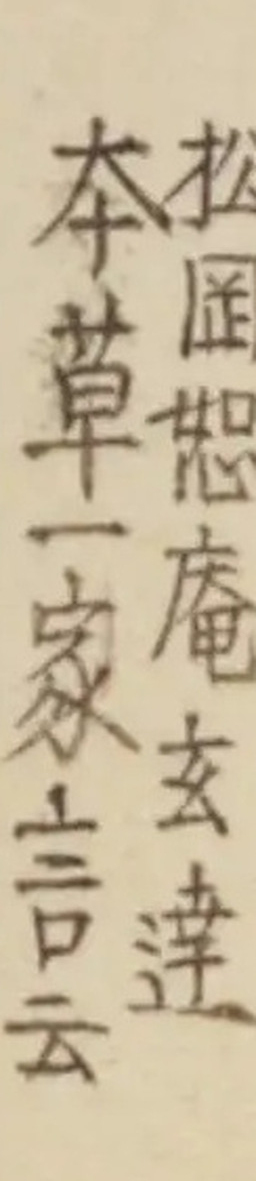本草一家言云

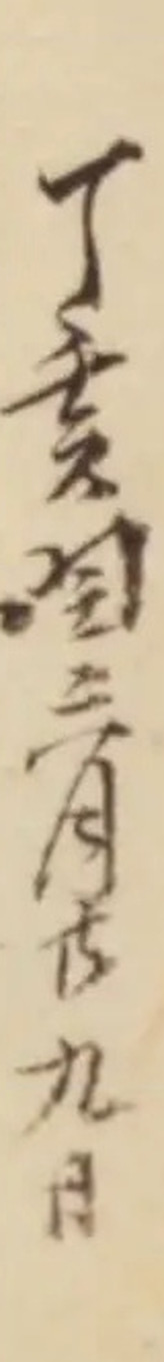丁亥閏三月廿九日
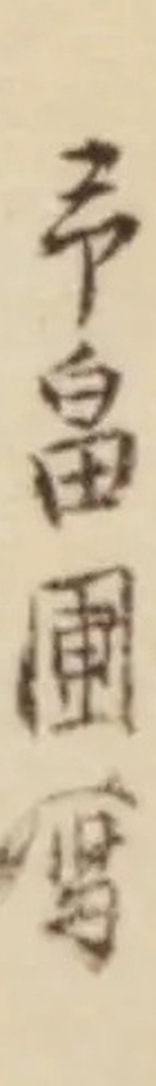予畠圃写
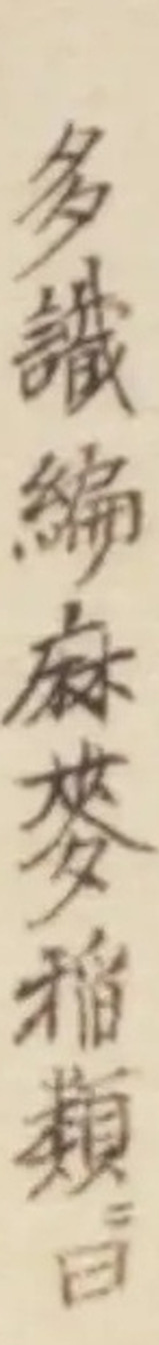多識編麻麥稲類曰
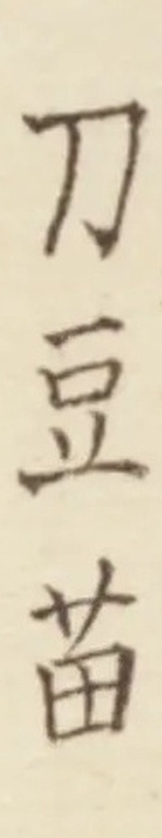刀豆苗

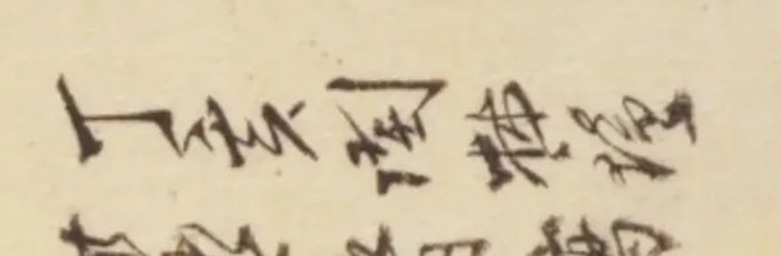丁亥閏林鐘
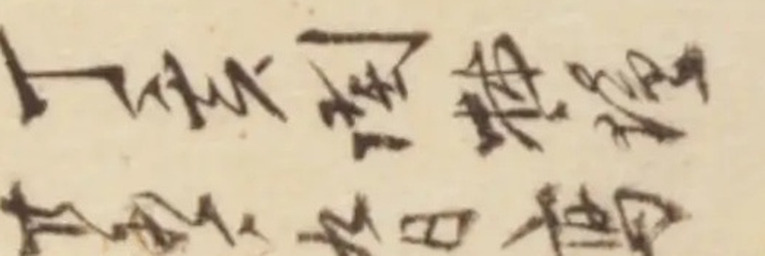丁亥閏林鐘

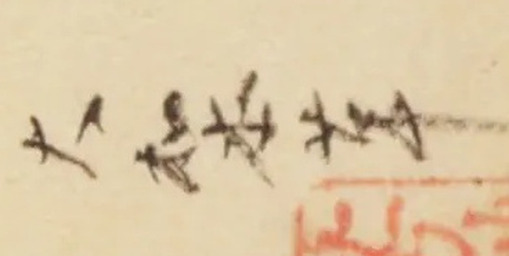大和本草
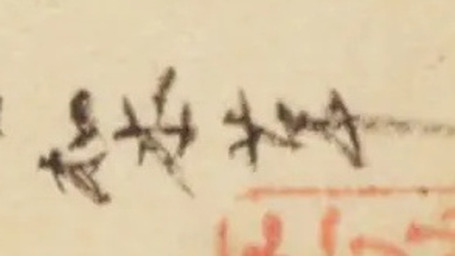大和本草
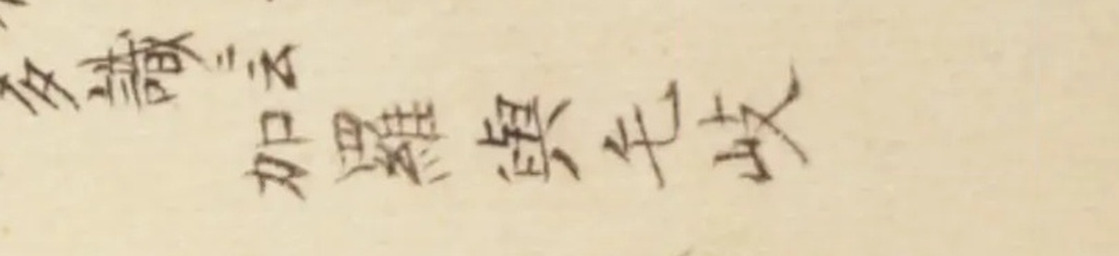加羅与毛岐
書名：梅園草木花譜夏之部. 4
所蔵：国立国会図書館 National Diet Library, JAPAN
